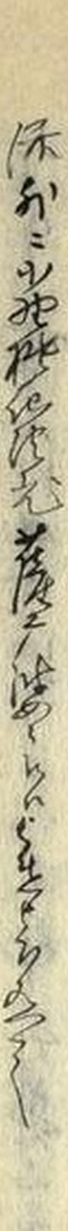済外ニ小野桃仙院老薩摩婆々江ハ被進被下有之
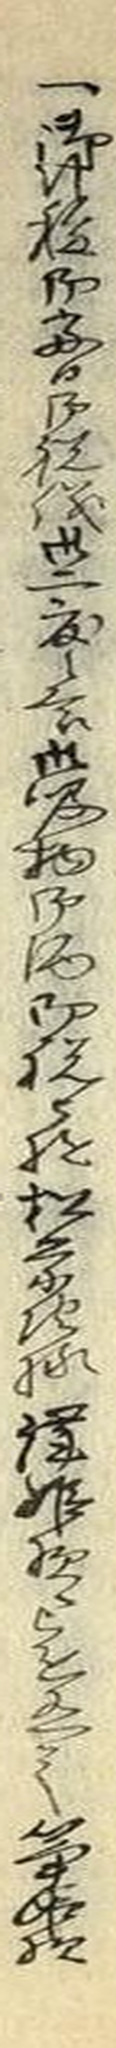一御引移御当日御祝儀御二度之節御吸物御酒御祝被遊松栄院様謹姫様へ被進有之箏姫様
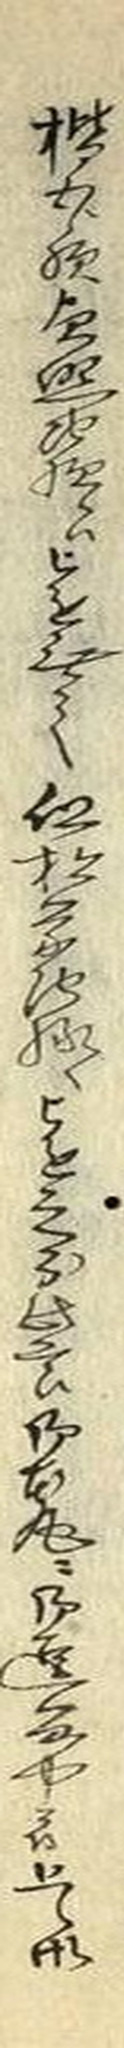楷五郎様貞照院様ヘハ被進無之但松栄院様へ被進之分此節御本丸ニ御逗留中ニ付上之御
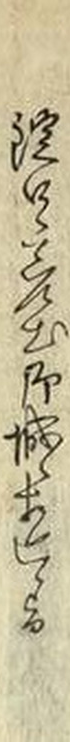錠口へ差出御城へ相廻候旨
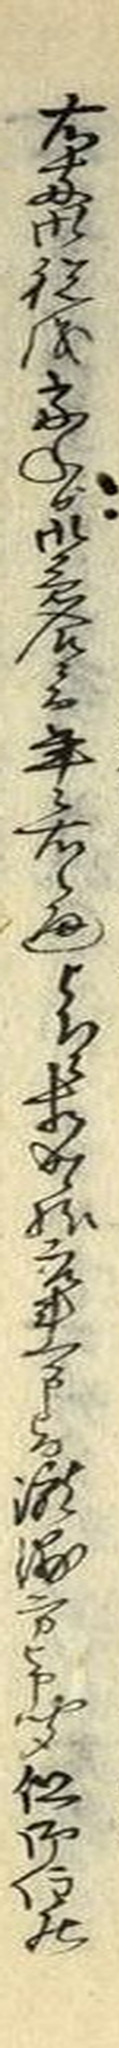右両御祝儀当年ゟ御兼合ニ而年々右之通被下ニ相成候様取計可申旨瀧浦方被申聞但御住居
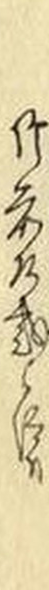御前頂戴被仰付
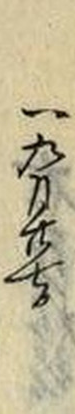一九月廿八日
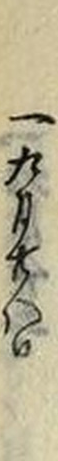一九月廿八日
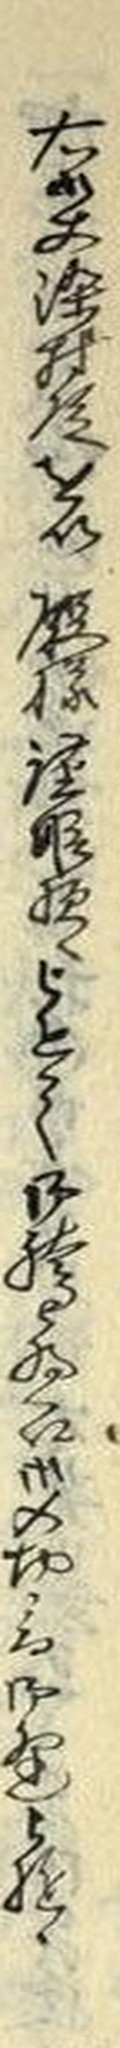右御使染村殿を以殿様謹姫様へ被進之御袴被為召御〆切ニ而御逢被遊候
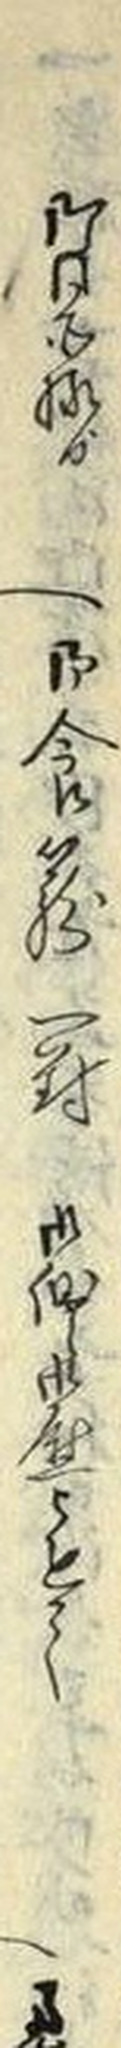御同所様ゟ御食籠一対御側御慰被進之奥
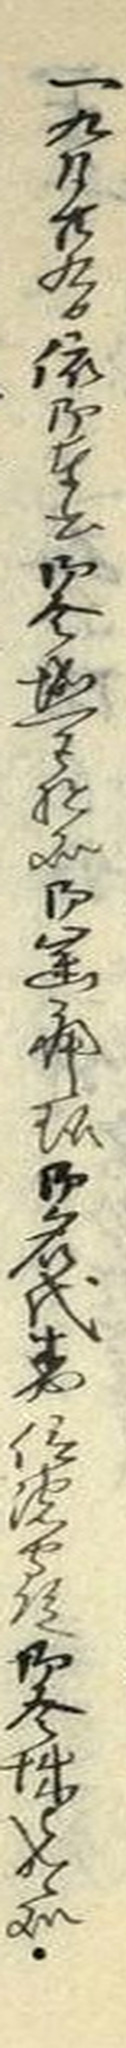一九月廿九日依御奉書御登城被遊候処御歯痛之趣御名代森信濃守殿御登城被成候処
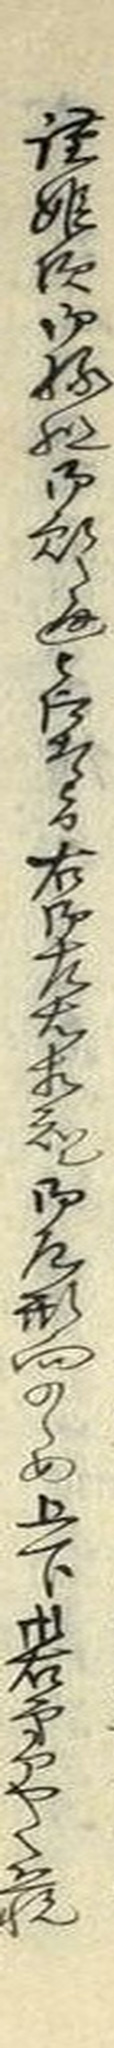謹姫様御縁組御願之通被仰出候旨右御左右相知レ御屋形向のしめ上下御右筆部屋へ恐悦申上候
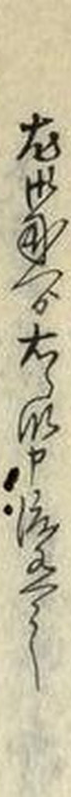尤御用人ゟ右之段申渡有之
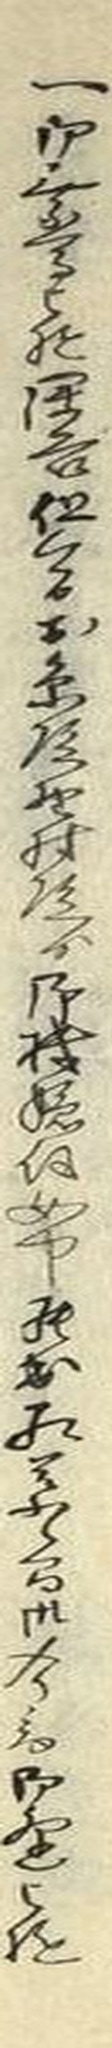一御乗馬被遊深谷但今日お糸殿野村殿ゟ御機嫌伺女中罷出紅葉之間御入りニ而御逢被遊
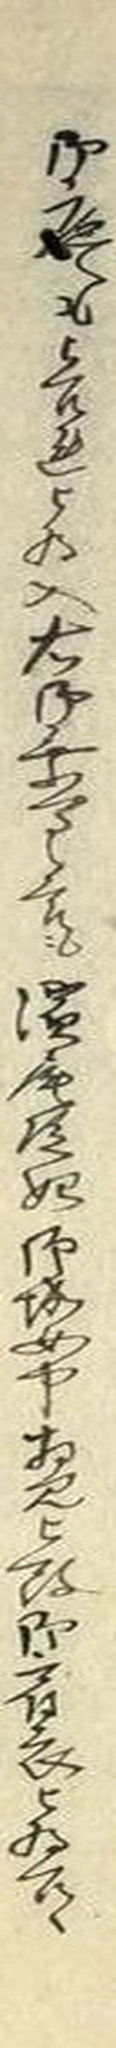御庭へも被召連被為入右御乗馬之節も浜尾殿始御城女中拝見被致御肩衣被為召候

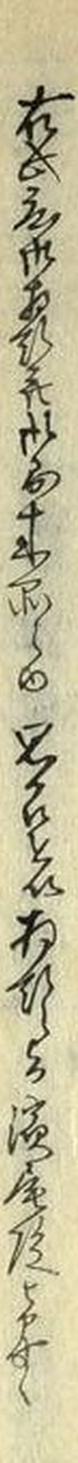右此度御拝領幷御到来品之内思召を以拝領之旨浜尾殿被申聞候
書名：少傅日録抄（斉善付側向頭取日記、在府）
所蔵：福井県文書館 Fukui Prefectural Archives
